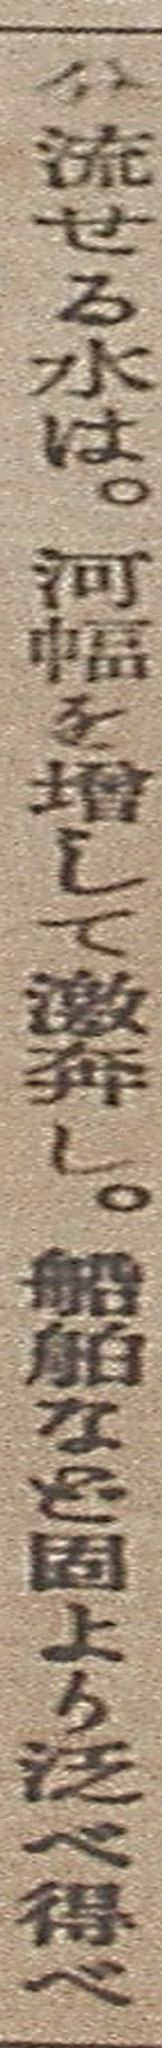分流せる水は。河幅を増して激奔し。船舶など固より泛べ得べ
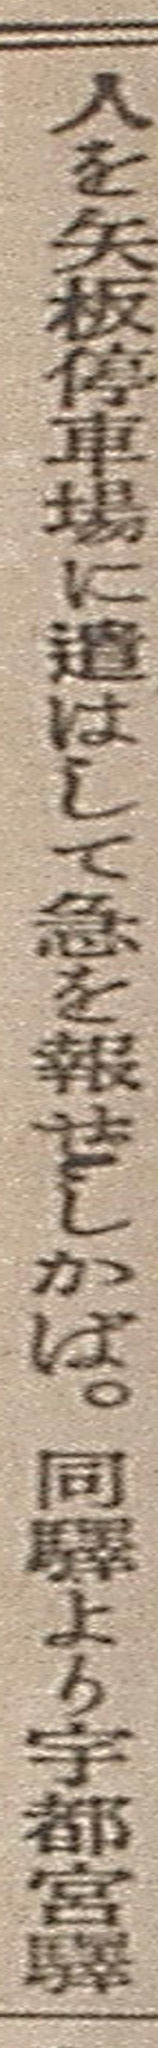人を矢板停車場に遣はして急を報せしかば。同駅より宇都宮駅
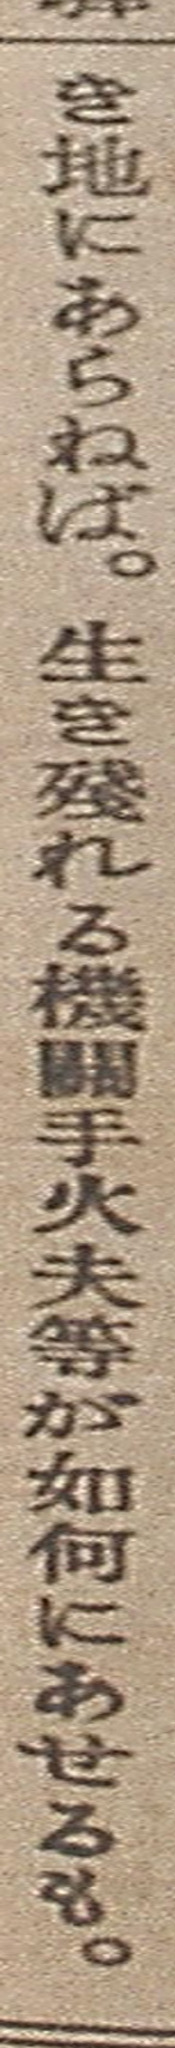き地にあらねば。生き残れる機関手火夫等が如何にあせるも。
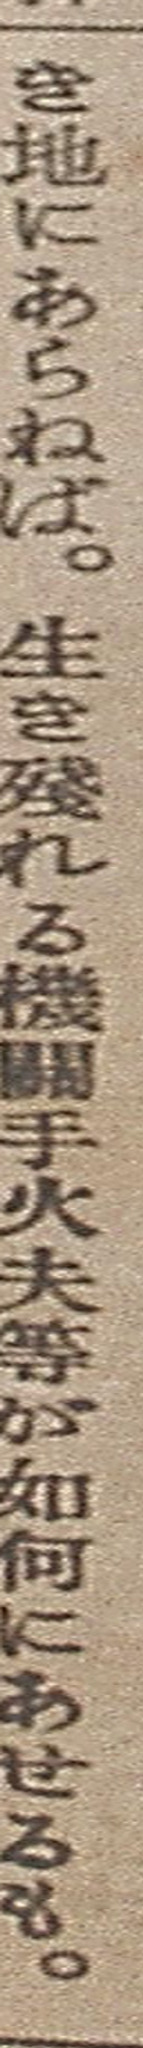き地にあらねば。生き残れる機関手火夫等が如何にあせるも。

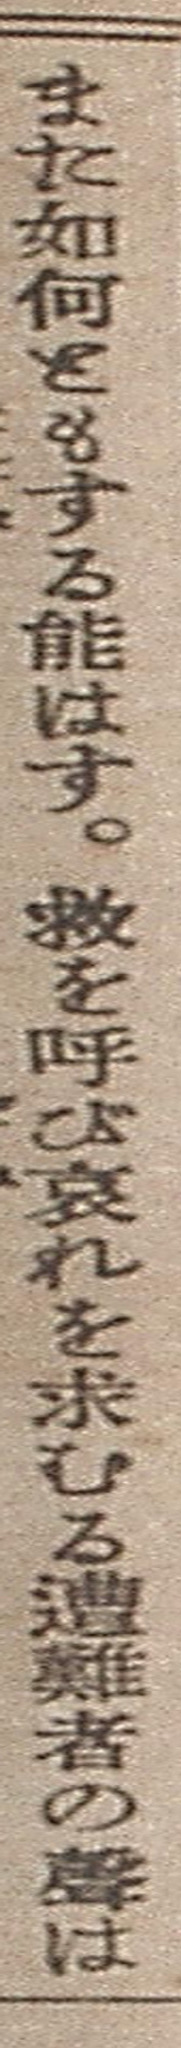また如何ともする能はす。救を呼び哀れを求むる遭難者の声は
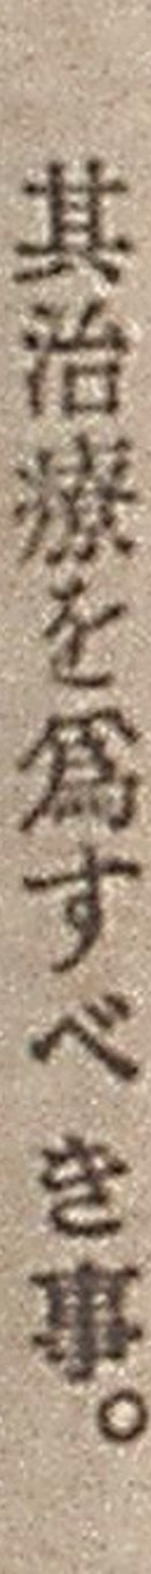其治療を為すべき事。
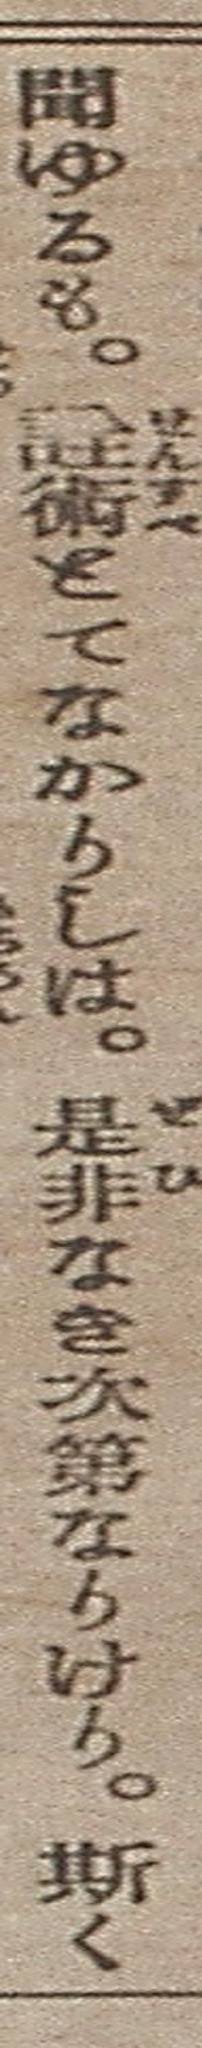聞ゆるも。詮術とてなかりしは。是非なき次第なりけり。斯く
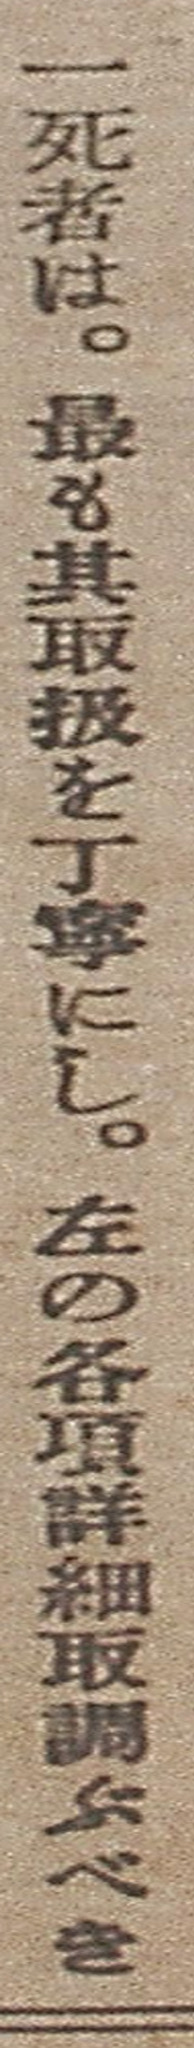一死者は。最も其取扱を丁寧にし。左の各項詳細取調ぶべき
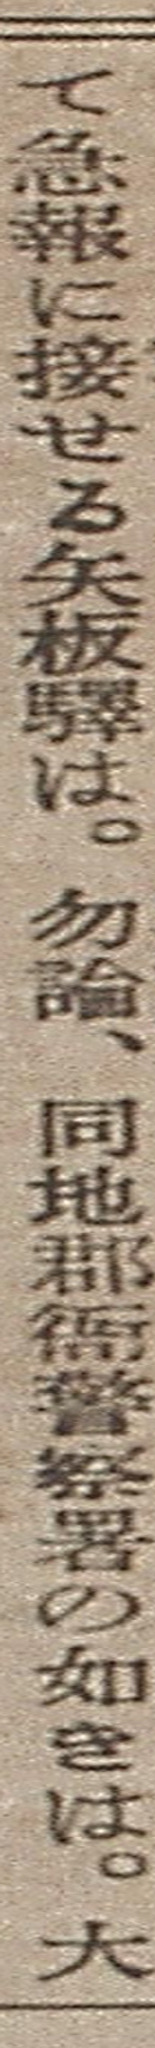て急報に接せる矢板駅は。勿論、同地郡衙警察署の如きは。大
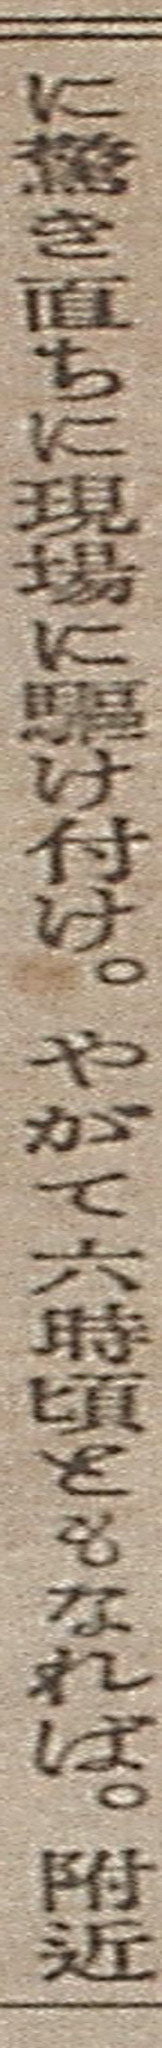に驚き直ちに現場に駆け付け。やがて六時頃ともなれば。付近
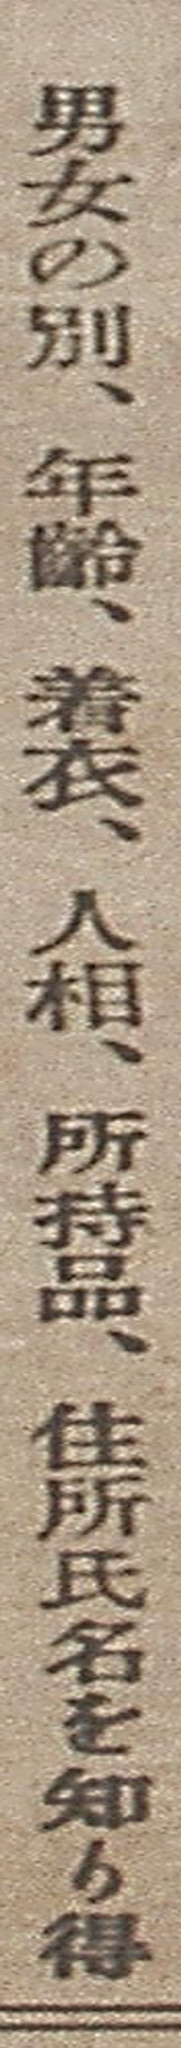男女の別、年齢、着衣、人相、所持品、住所氏名を知り得
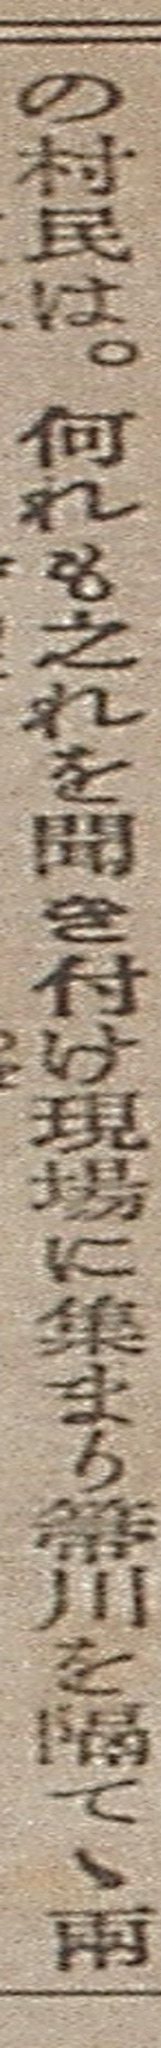の村民は。何れも之れを聞き付け現場に集まり箒川を隔てゝ両
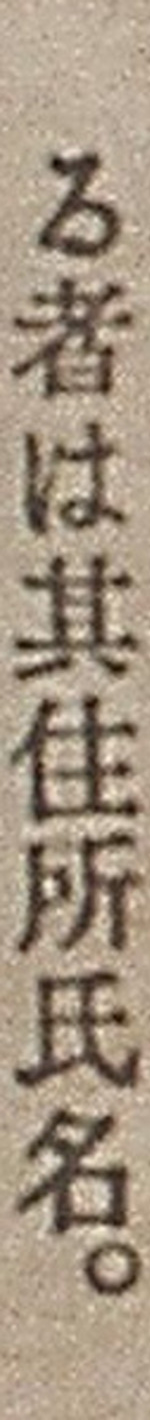る者は其住所氏名。
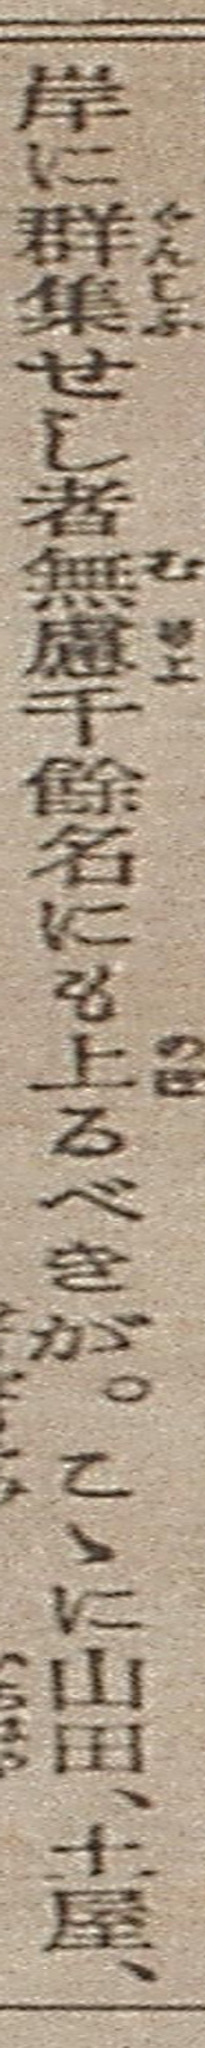岸に群集せし者無慮千余名にも上るべきが。こゝに山田、土屋、
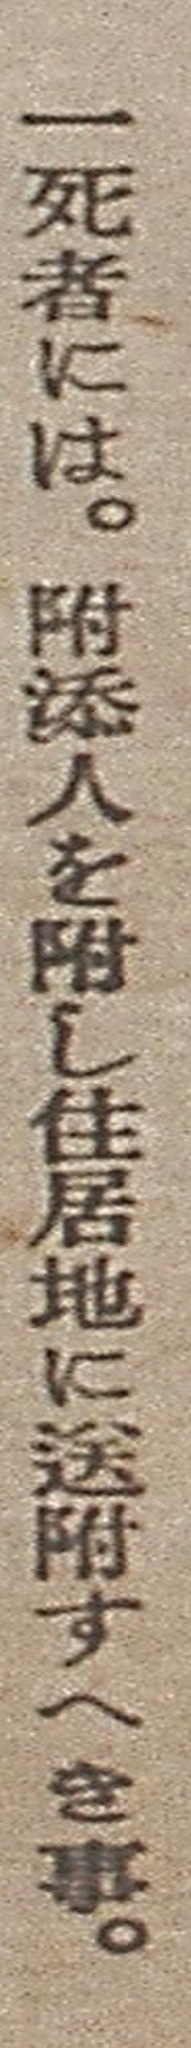一死者には。付添人を付し住居地に送付すへき事。
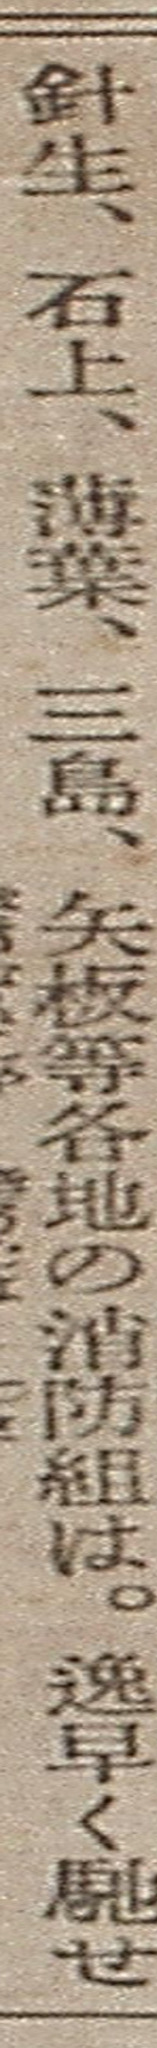針生、石上、薄葉、三島、矢板等各地の消防組は。逸早く馳せ
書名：風俗畫報臨時増刊第百九十九號　明治三十二年十月各地災害圖會（前編之續）
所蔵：東京大学地震研究所図書室 Earthquake Research Institute Library, The University of Tokyo, JAPAN
